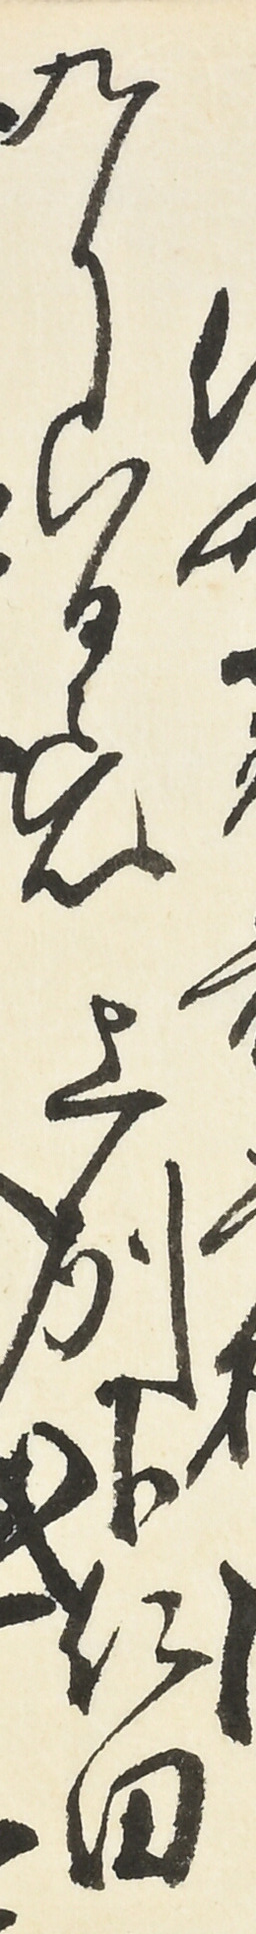九月八日着上州下仁田
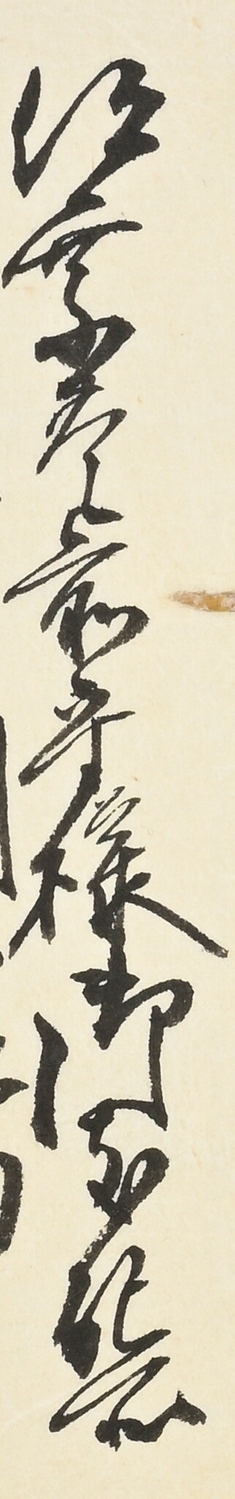伊奈豊前守様御支配所
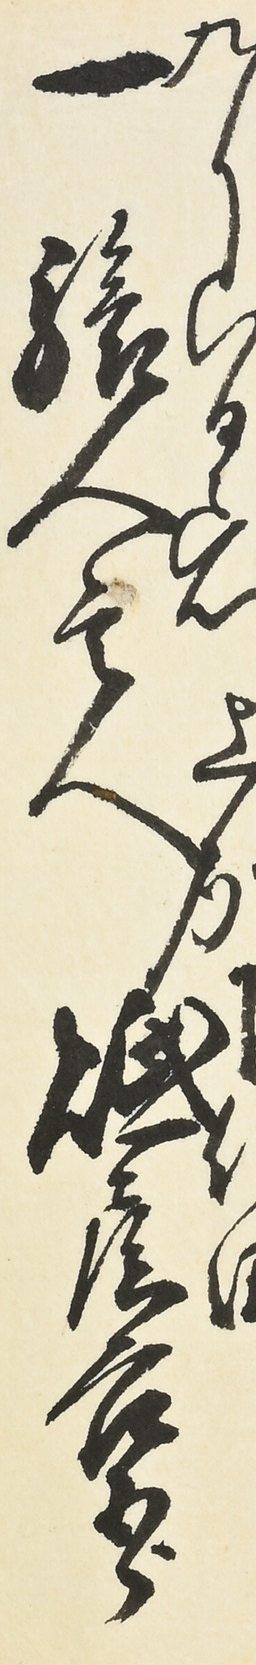一旅人壱人砥屋吉五郎
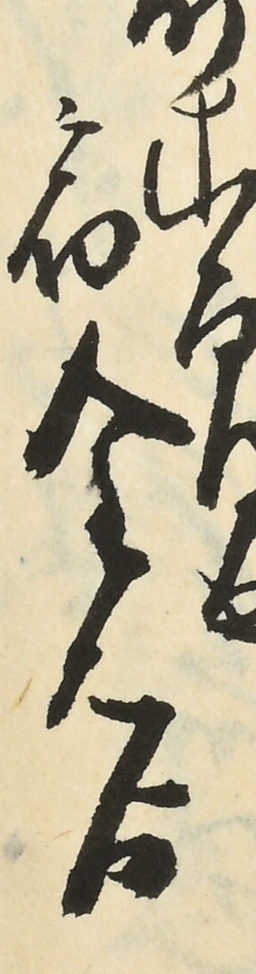宿清左衛門

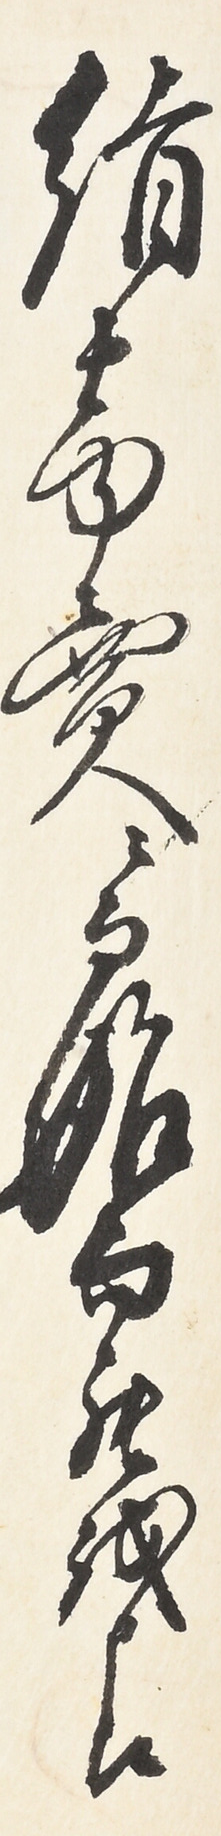絹商売ニ而始而罷越申候
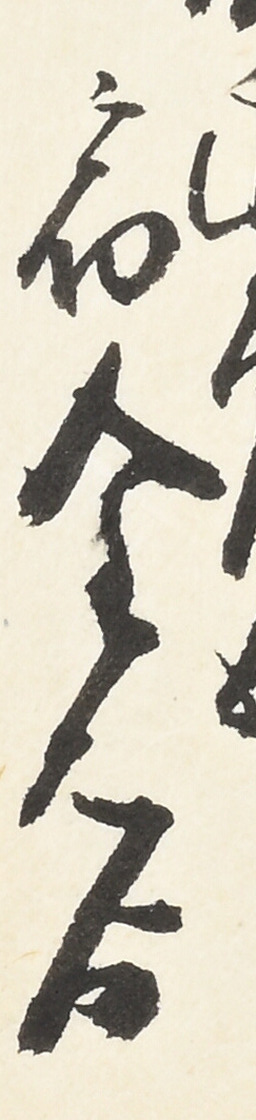宿金右衛門
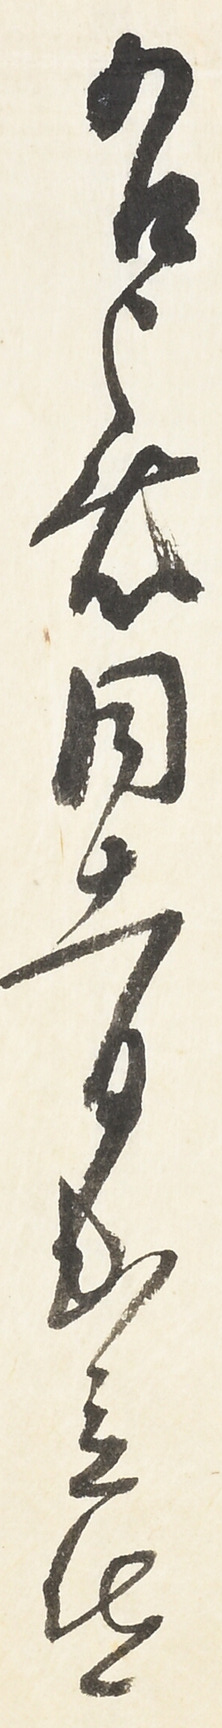右之者同十一日出立仕候
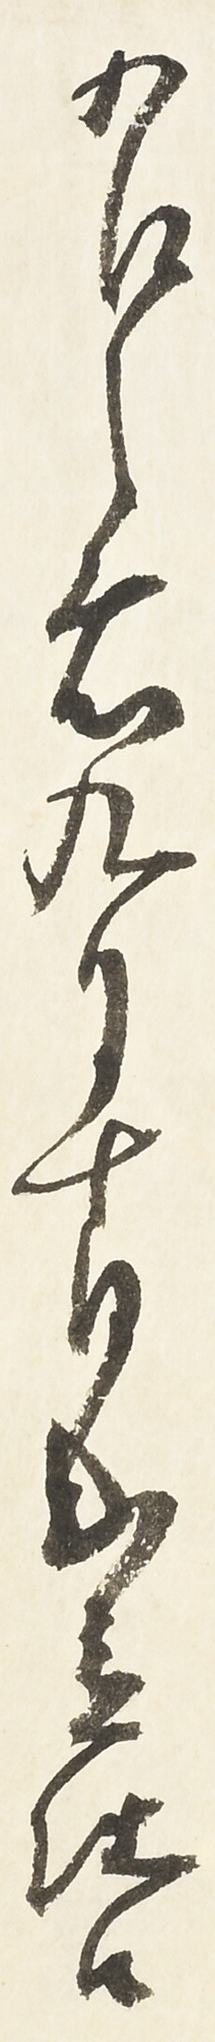右之者九月十日出立仕候
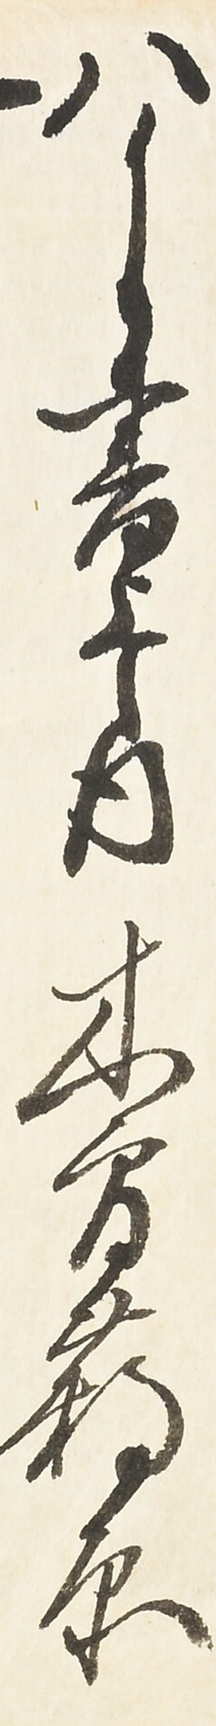八月書上之内木曽藪原
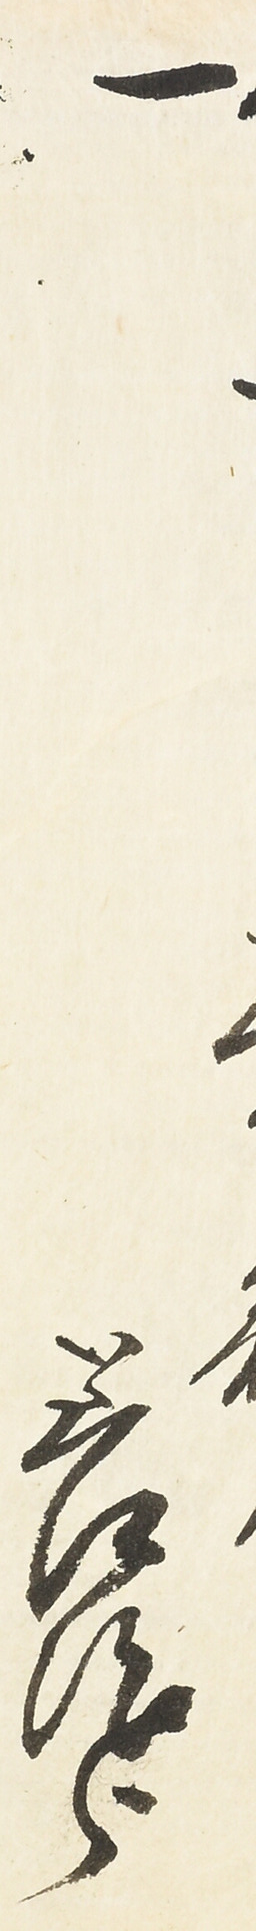一善治郎
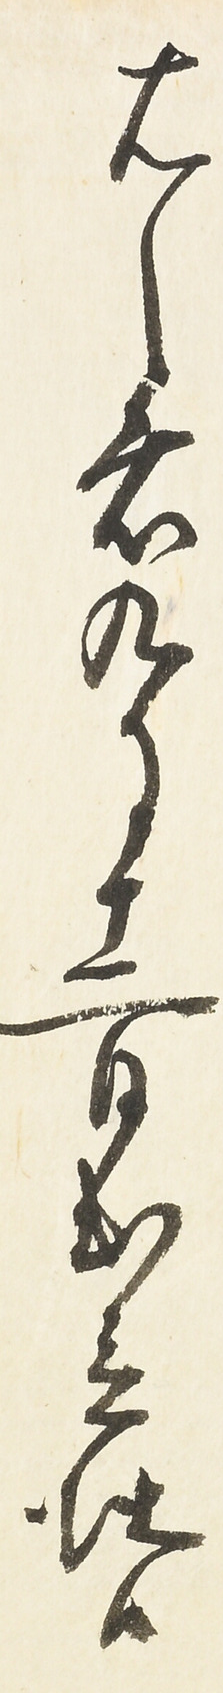右之者九月十二日出立仕候
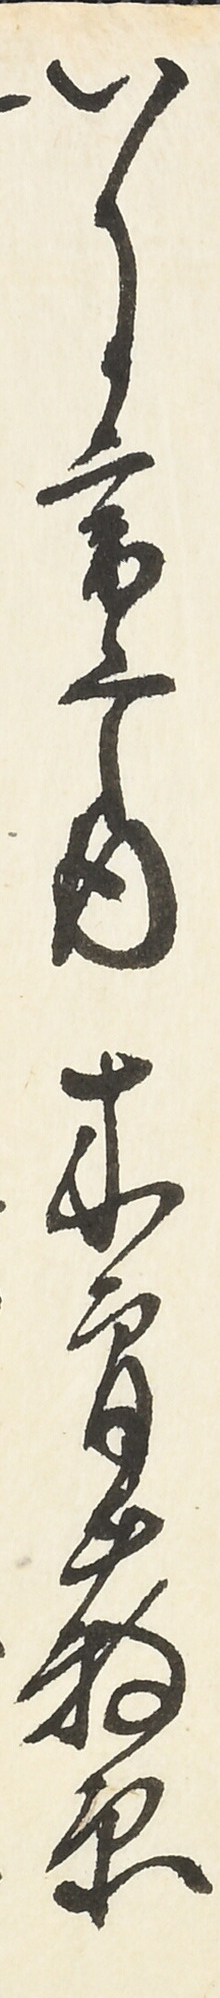八月書上之内木曽藪原
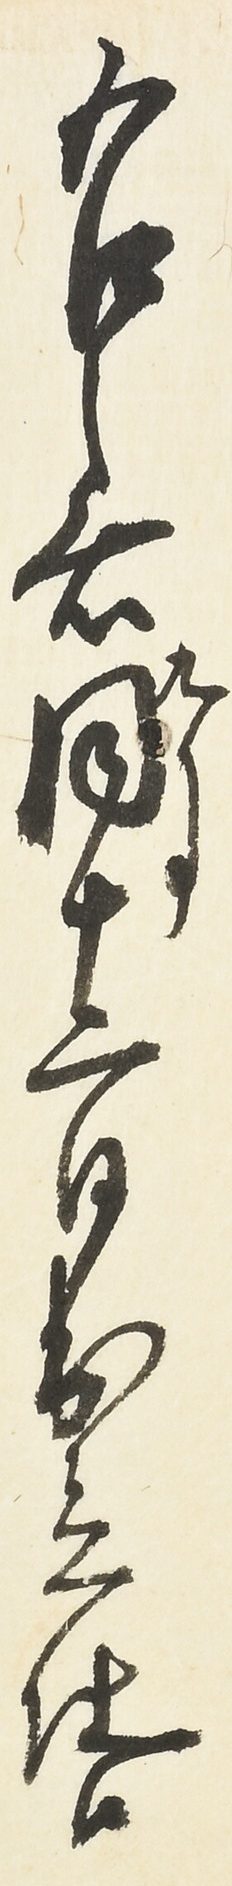右之者同十二日出立仕候
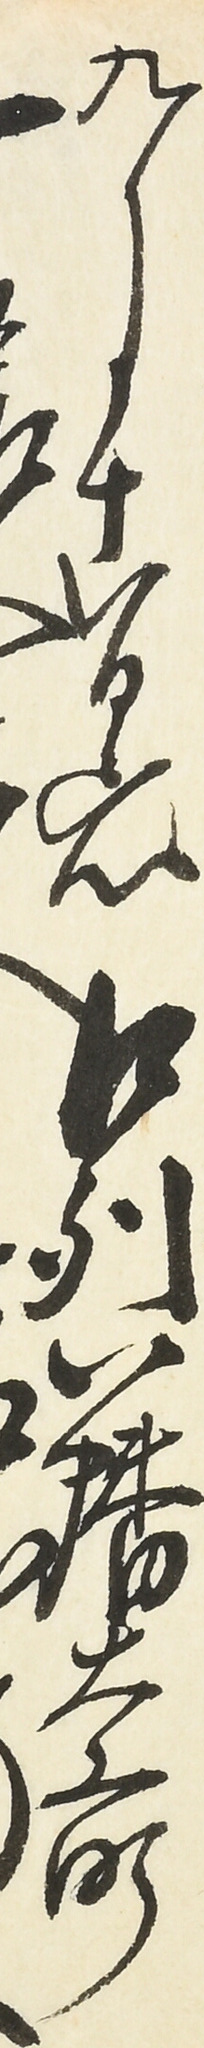九月十八日着江州八幡大工町
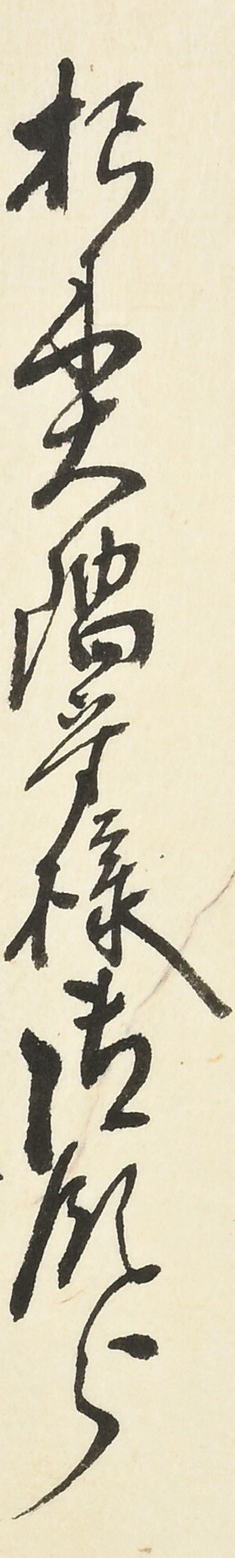朽木大隅守様御領分
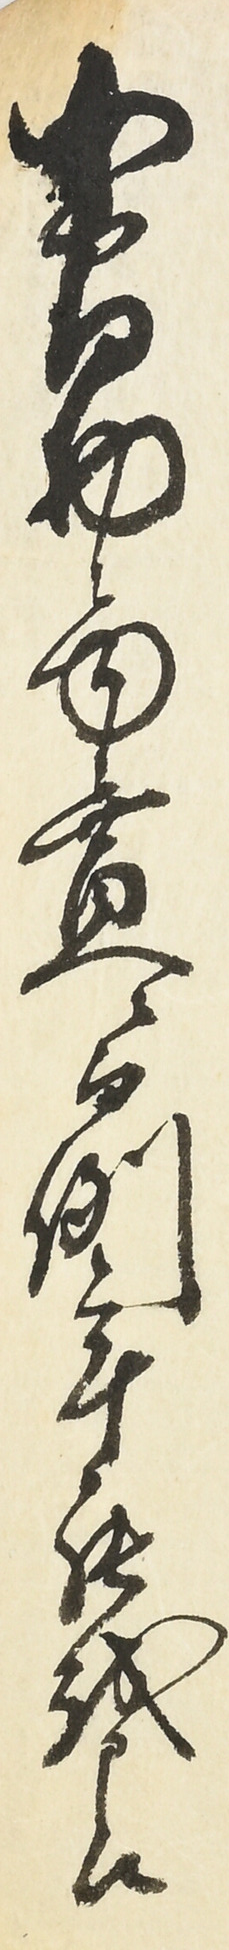小間物商売ニ而例年罷越申候
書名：町中旅人泊控帳
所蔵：伊那市立高遠町図書館・合同会社AMANE
